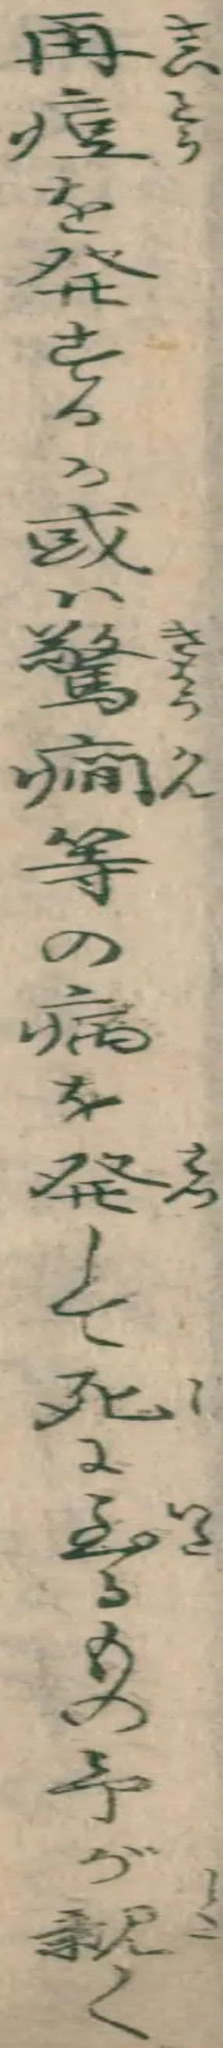再痘を発するか或は驚癇等の病を発して死に至るもの予が親く
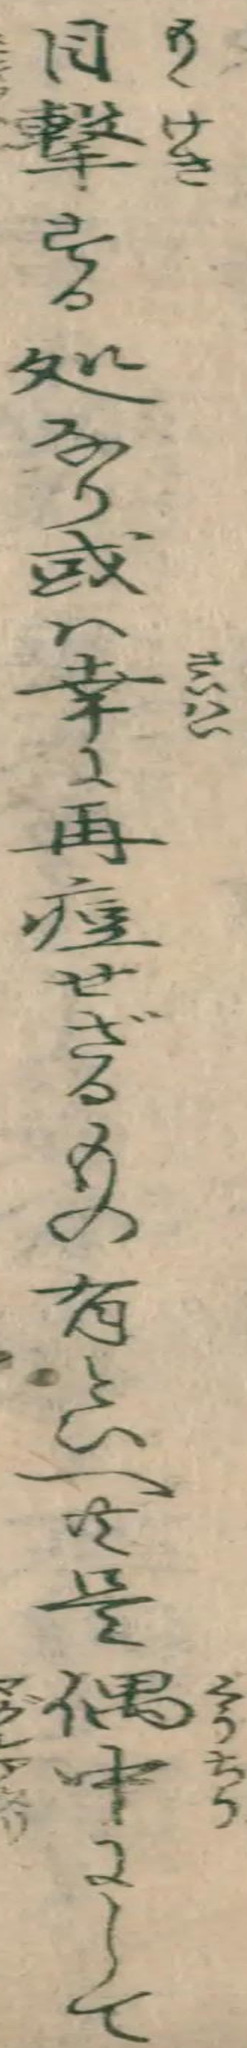目撃する処なり或は幸に再痘せざるもの有といへ其是偶中にして
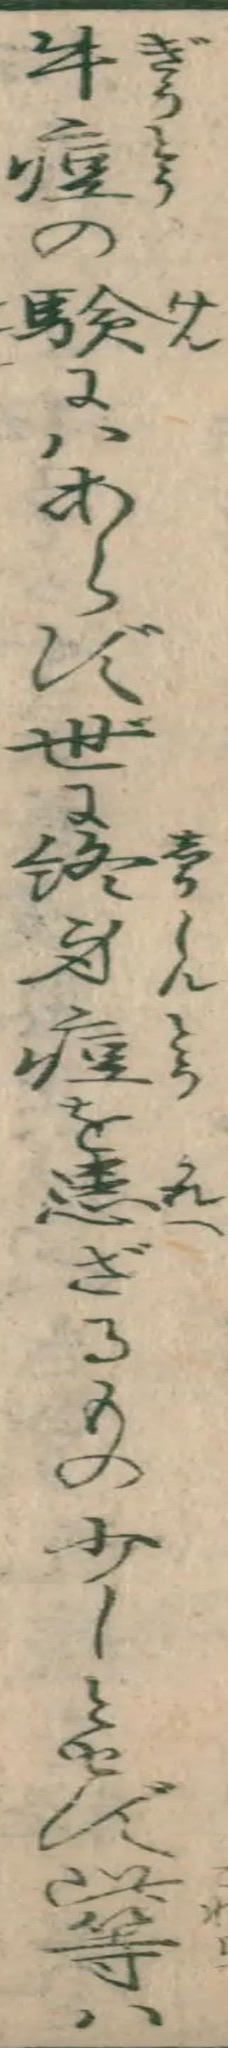牛痘の験にはあらず世に終身痘を患ざるもの少しとせず此等は
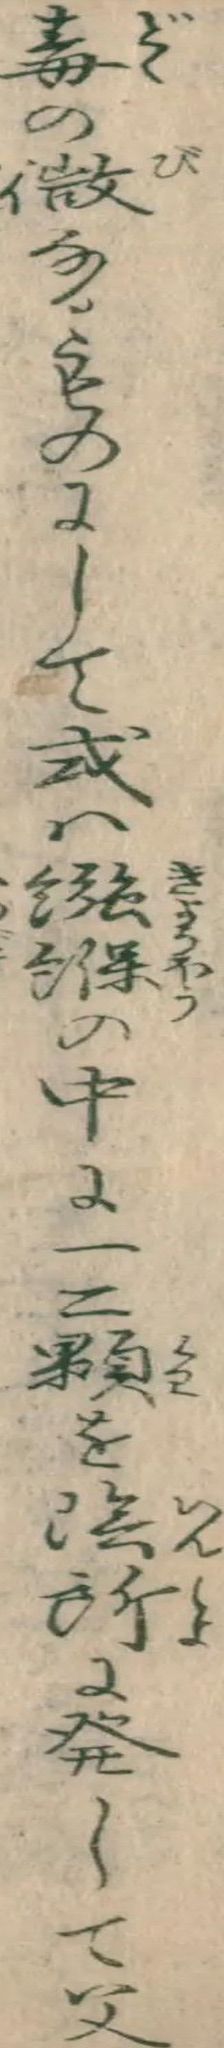毒の微なるのにして或は繦緥の中に一二顆を陰所に発して父
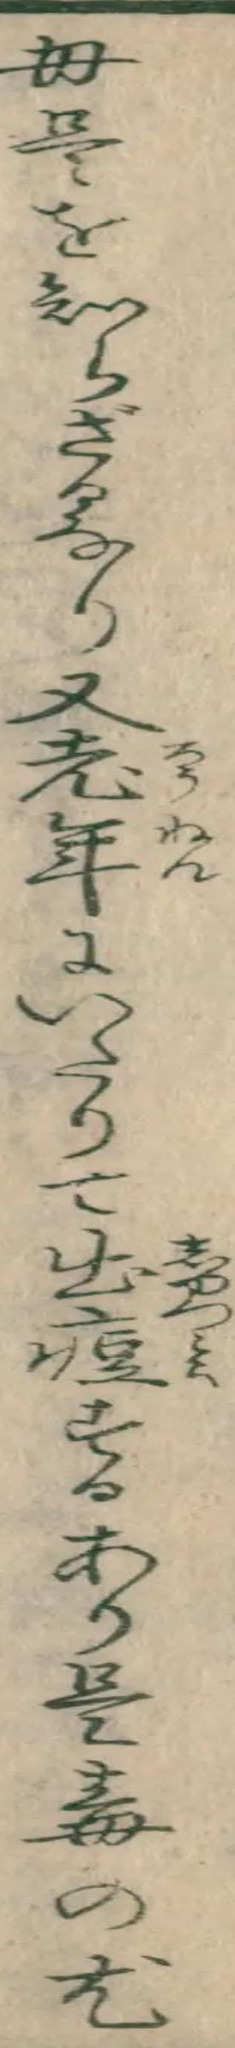母是を知らざるなり又老年にいたりて出痘するあり是毒の尤
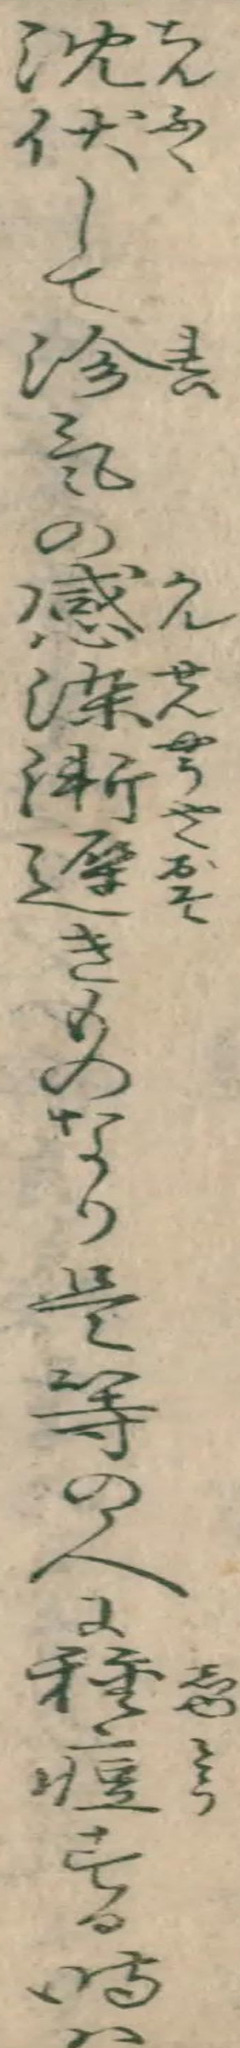沈伏して沴気の感染漸遅きものなり是等の人に種痘する時は
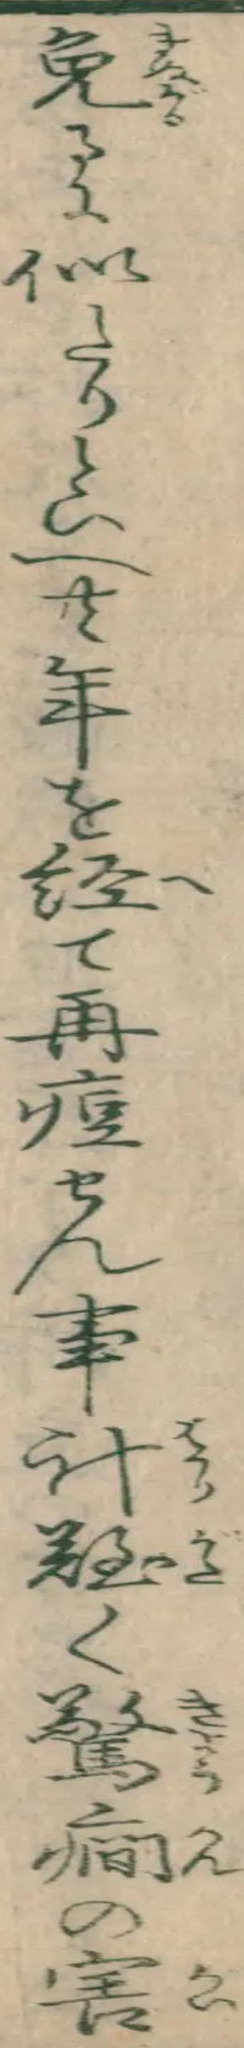免るんい似たりといへ其年を経て再痘せん事計難く驚癇の害
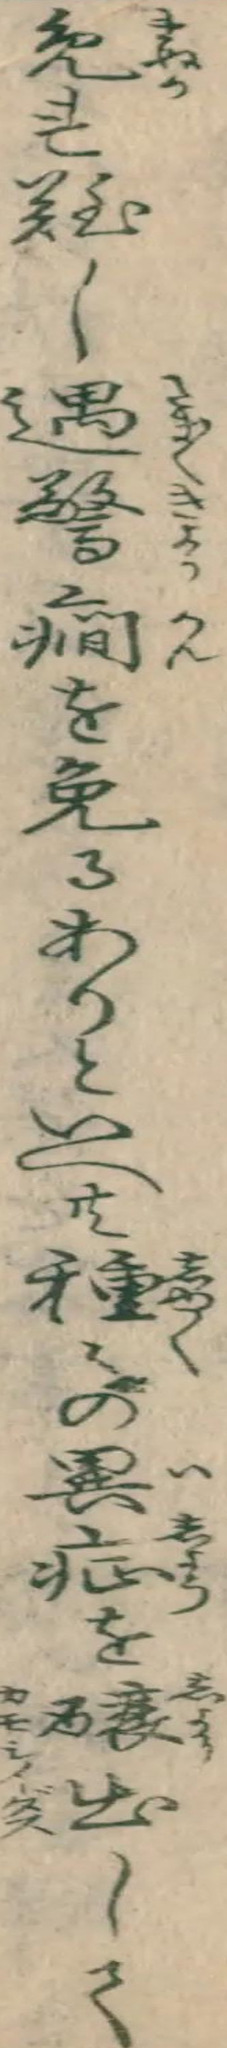免れ難く遇驚癇を免るありといへ其異症を醸出して
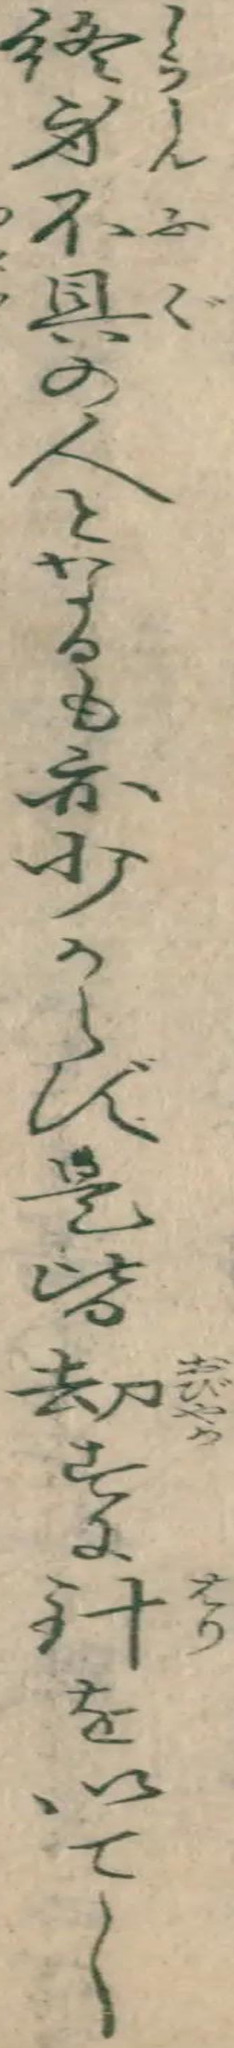終身不具の人となるも亦少からず是皆却すに針を以てし
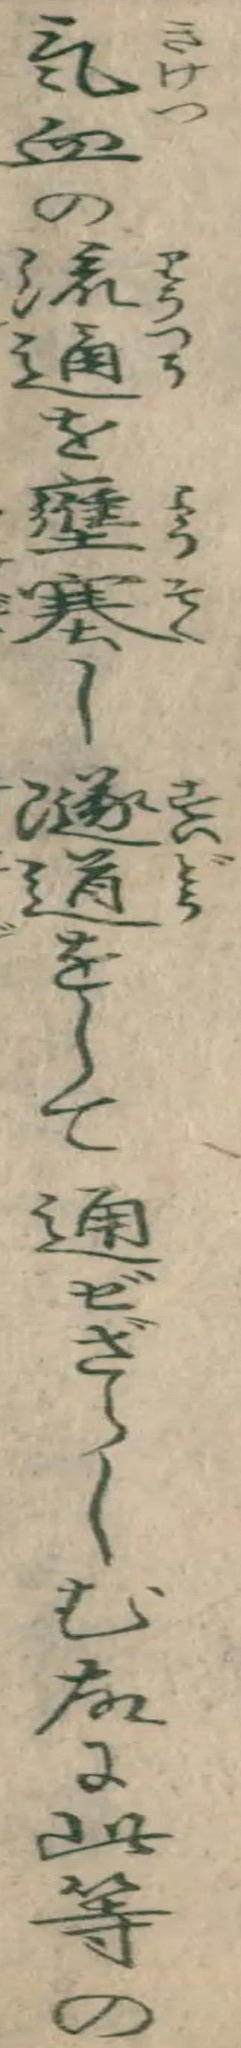気血の流通を壅塞し隧道をして通ぜざらしむ故に此等の

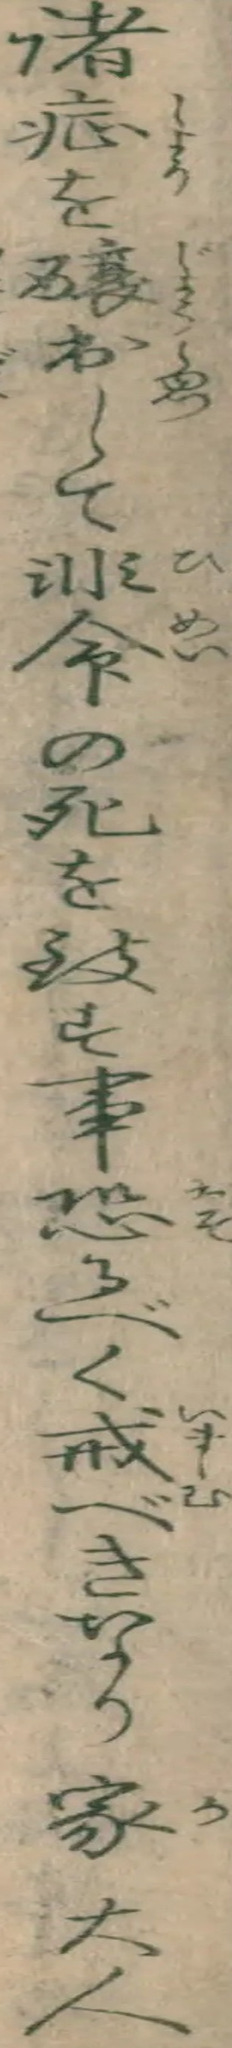諸症を醸出して非命の死を致す事恐るべしなり家大人
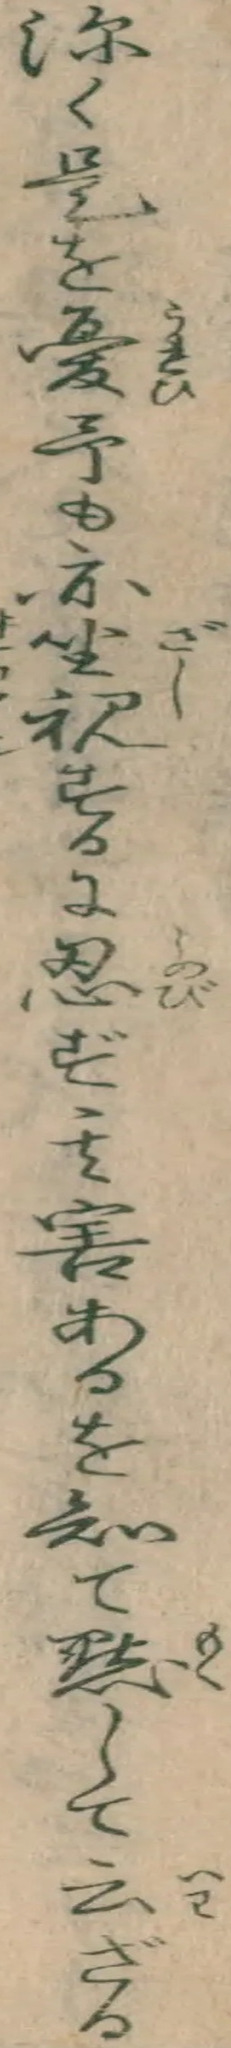深く是を憂予も亦坐視するに忍ず其害あるを知て黙して云ざる
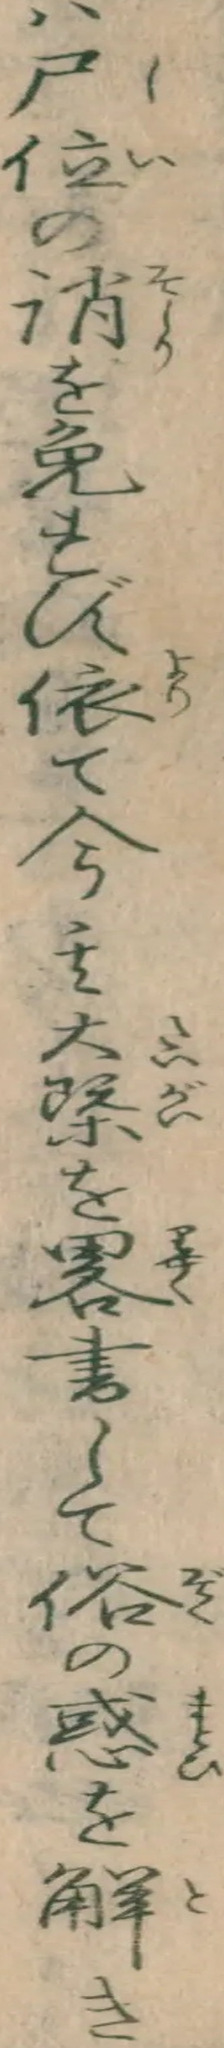は尺位の誚を免れず依て今其大を畧書して俗の惑を觧き
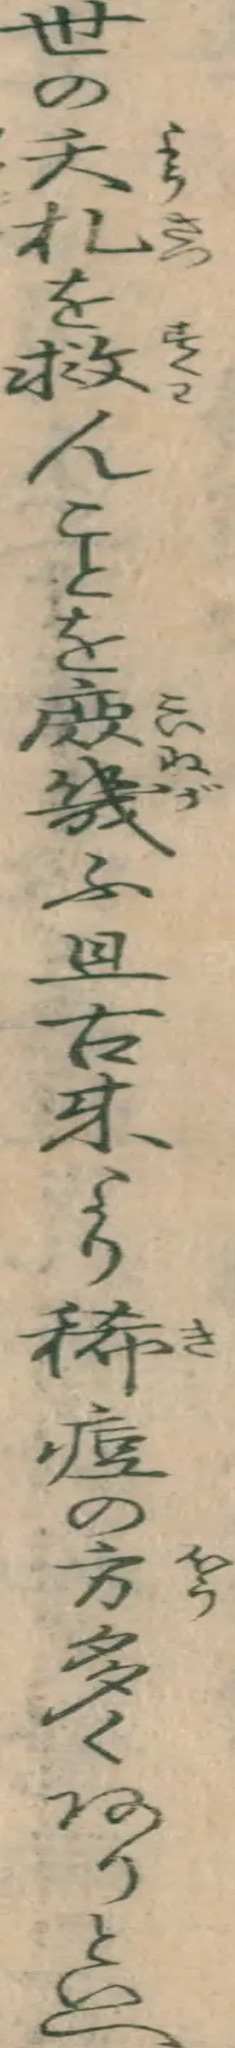世の夭札を救んことを庻幾ふ且古来より稀痘の方多くありといへ
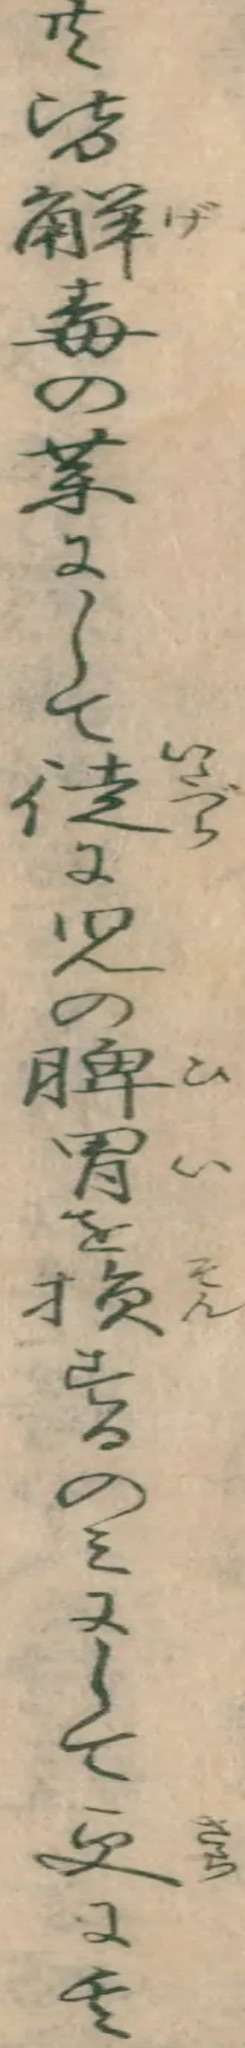其皆觧毒の薬にして徒に児の脾胃を損するのみにして更に其
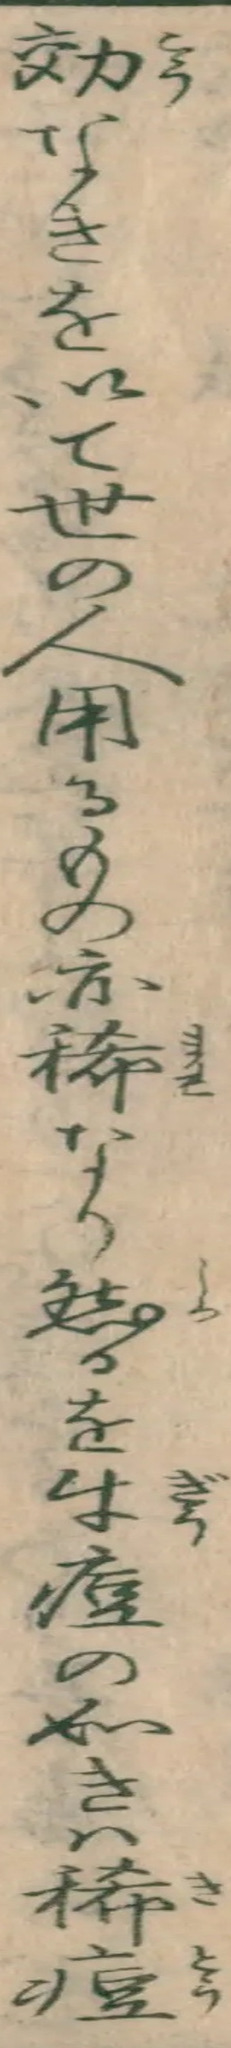効なきを以て世の人用るもの亦稀なり然るを牛痘の如きは稀痘
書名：牛痘辨非
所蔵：国立国会図書館 National Diet Library, JAPAN
